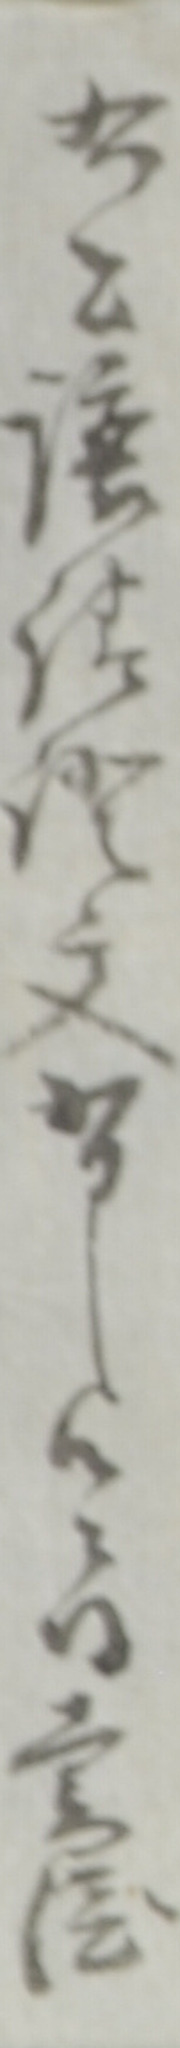右者譲請証文有之候ニ付実渡
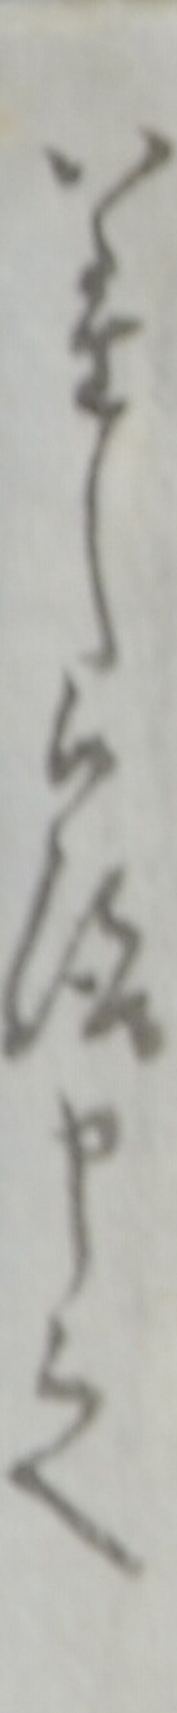いたし候趣申上候

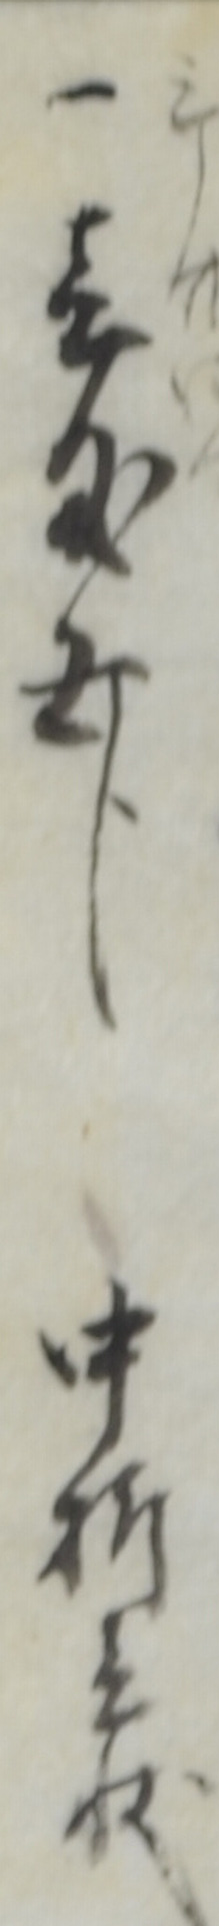一壱匁五分中折壱状
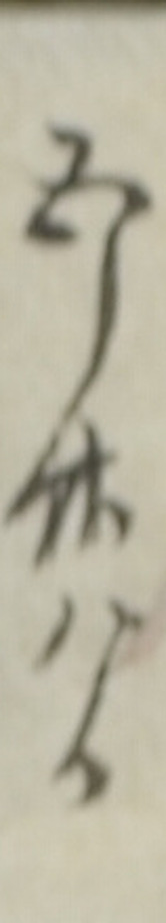五月廿八日
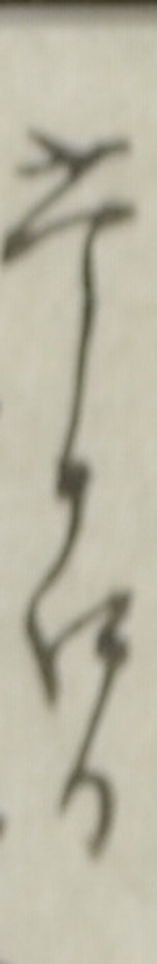六月十四日
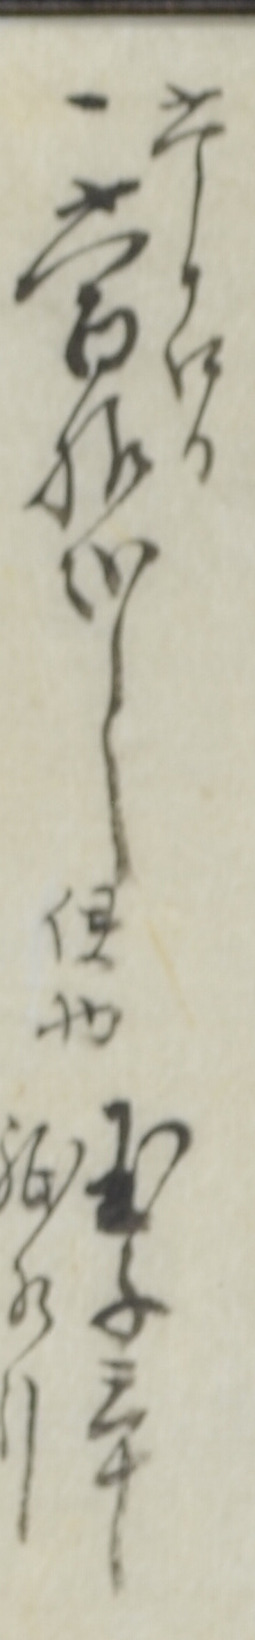一六百拾弐文使物玉子三十
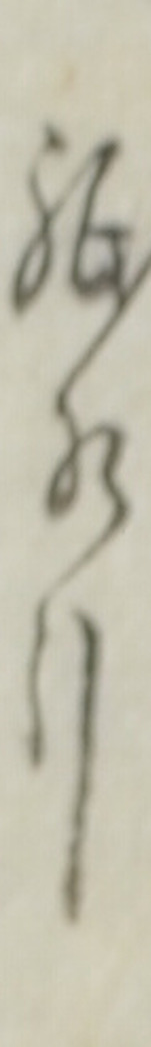紙水引
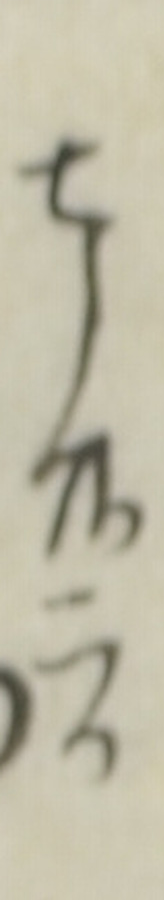七月廿ニ日
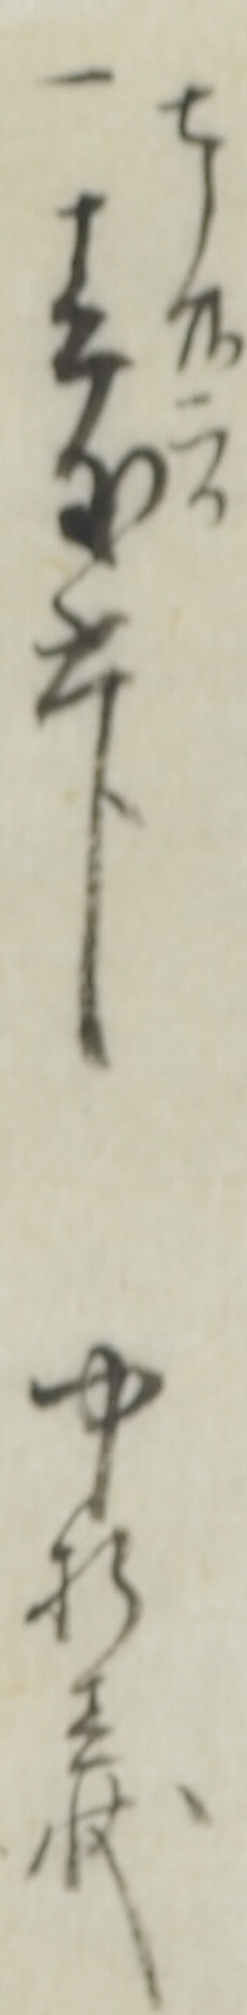一壱匁六分中折壱状
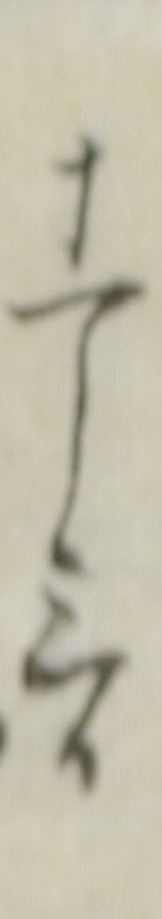十一月三日
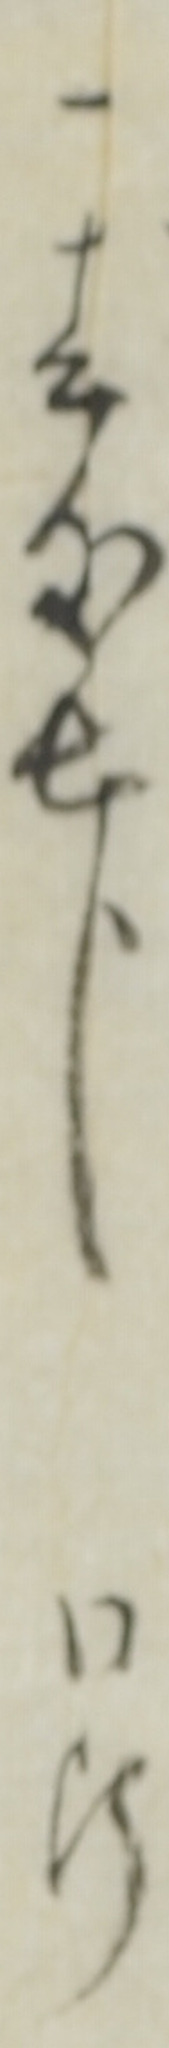一壱匁七分同断
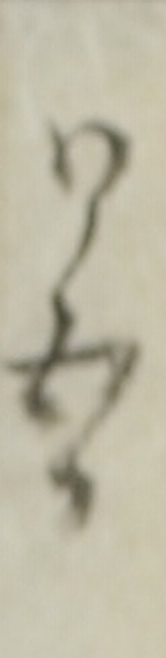同五日
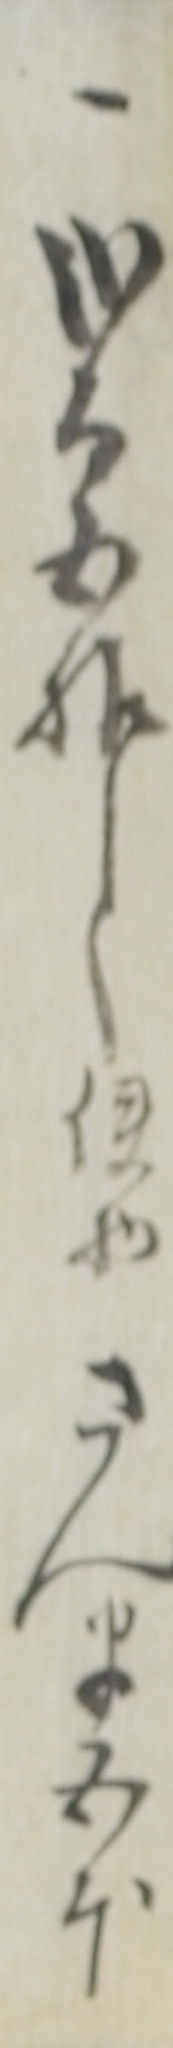一弐百五拾文使物さんま五本
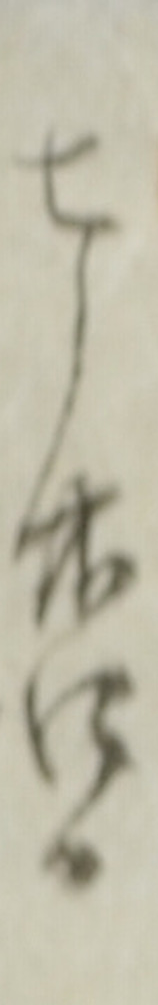七月廿四日
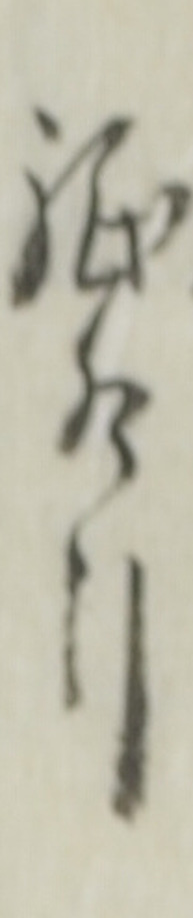紙水引
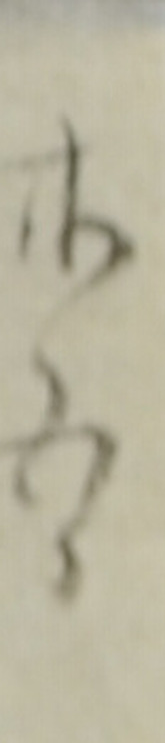廿五日
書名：（金銭書上控）
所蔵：伊那市立高遠町図書館・合同会社AMANE
